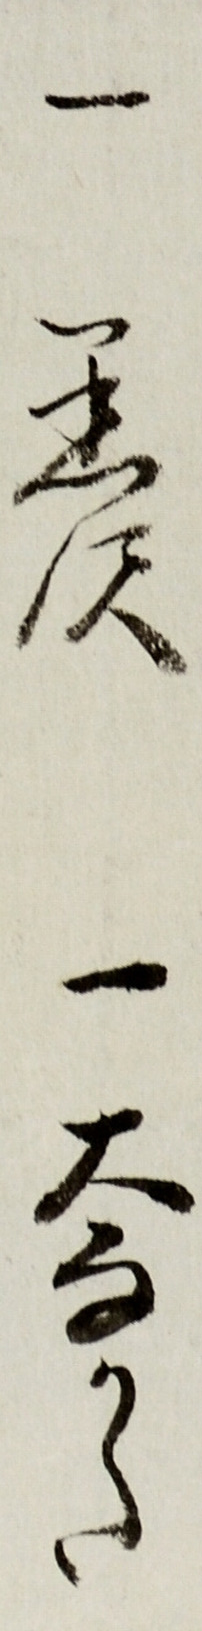一黒沢一大なかた
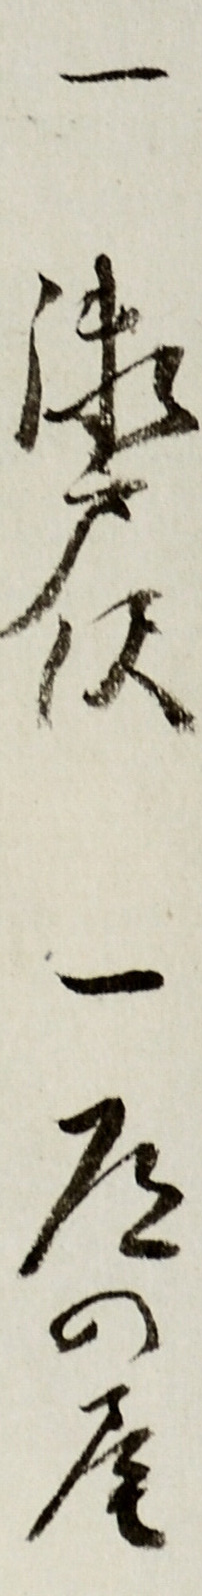一瀬戸沢一道の尾
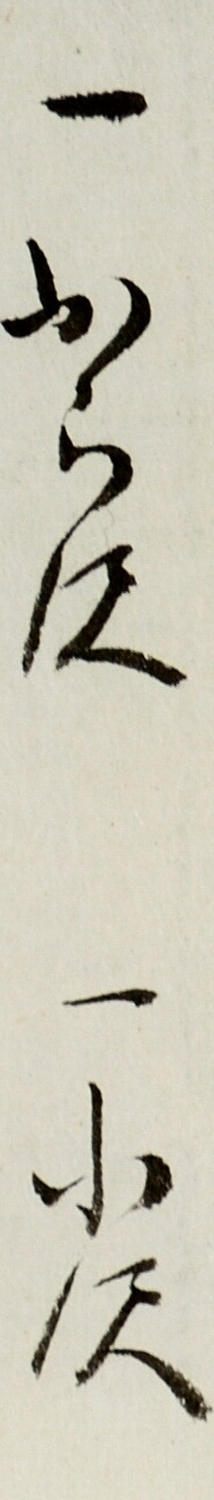一から沢一小沢
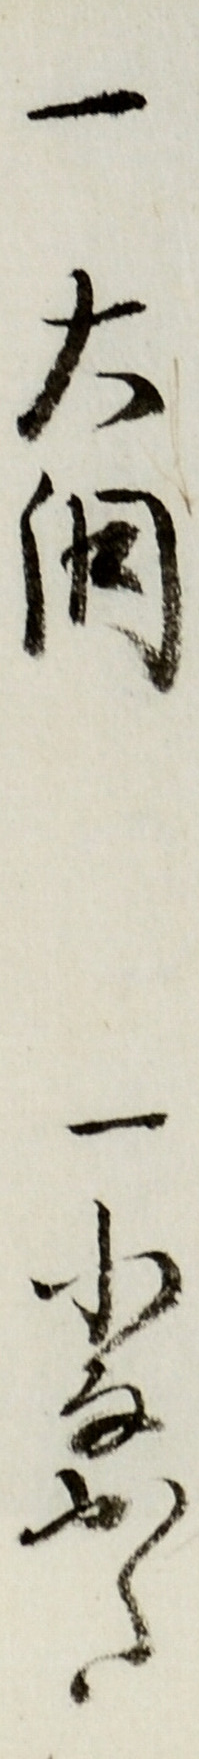一大洞一小なかた
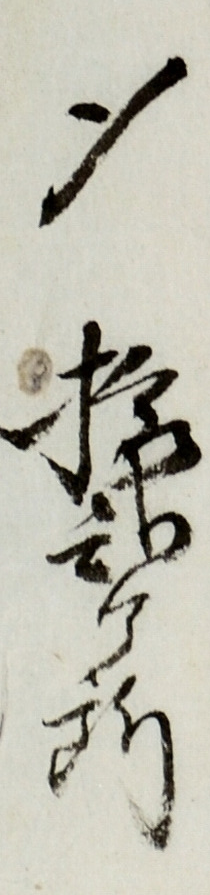〆拾弐ケ所
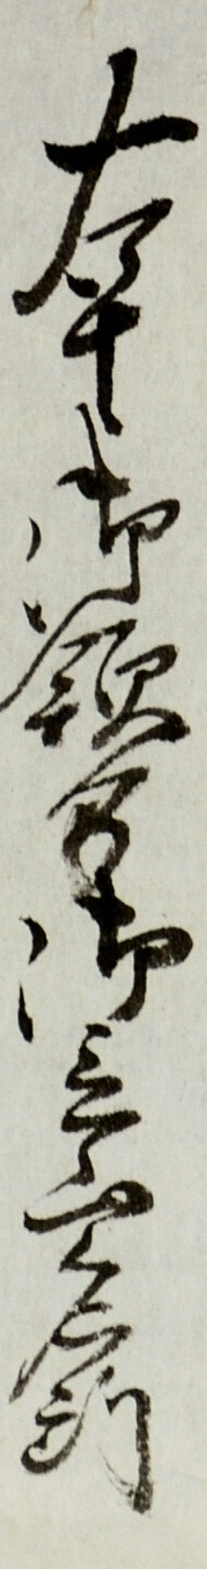右者御領分御立山名所
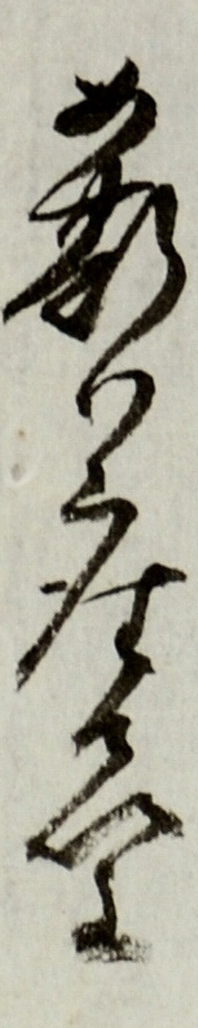如斯御座候以上
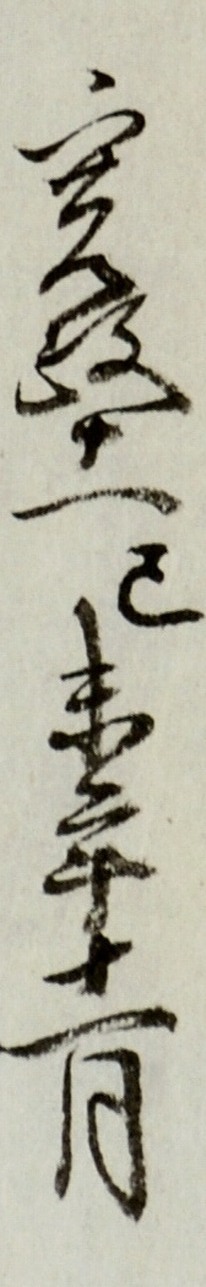寛政十一己未十一月
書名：御領分御立山名所附帳
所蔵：伊那市立高遠町図書館・合同会社AMANE
